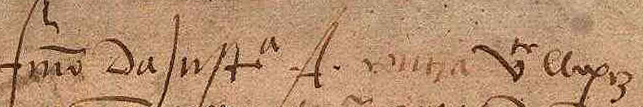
feito da Justa A. contra vte llopez
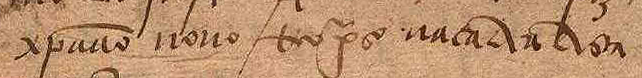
xpaão nouo Reo p̄so na cadea desta
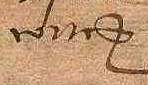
corte
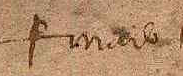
finado
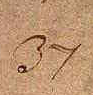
37
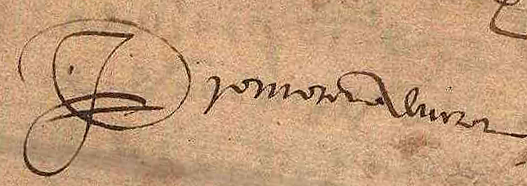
Promotor o douctor
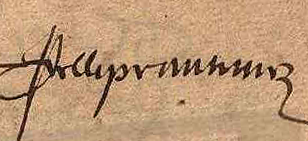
fellipe antunez
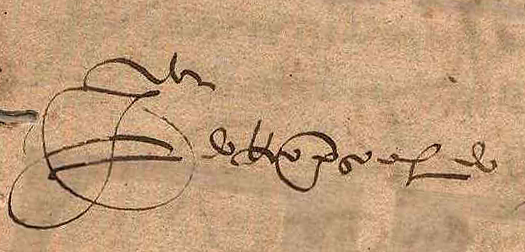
Pdor do Reo p̄so o Ldo
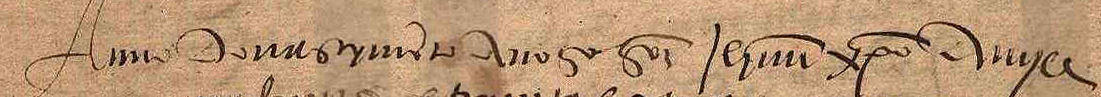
Anno do nascymēto de noso s̄or Jhūu xp̄o de mjll
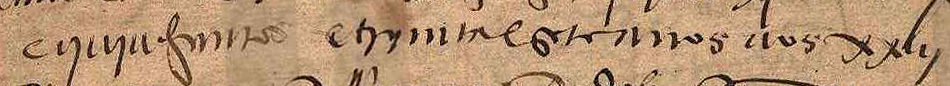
e qujnhemtos e trymta e sete anos aos xxiij
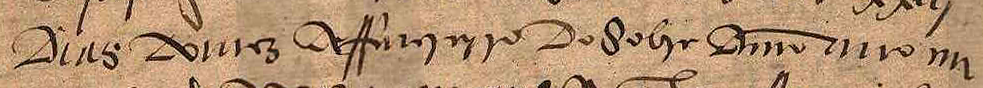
Dias do mez de ffeuereyro do Sobredito ano em
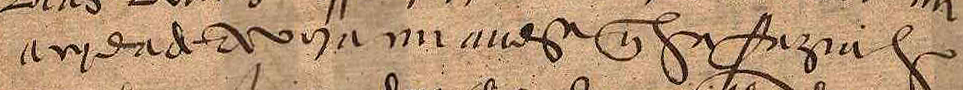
a cydade devora em auda q̄ hi fazia ho
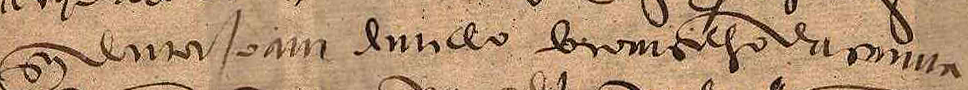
s̄or doutor Joam de mello do comselho da samta
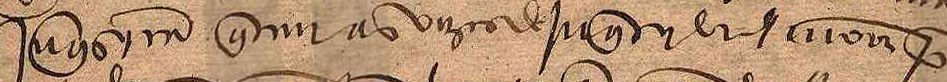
Jnq̄syçā q̄ tem as vezes de Jnq̄sydor moor p̄o
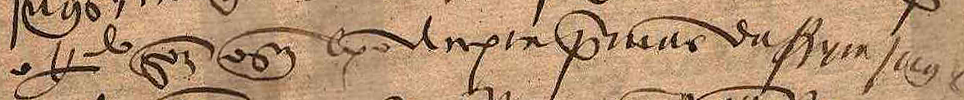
o Rdo s̄or o s̄or bp̄o de cepta p̄mas daffryca Jnq̄y
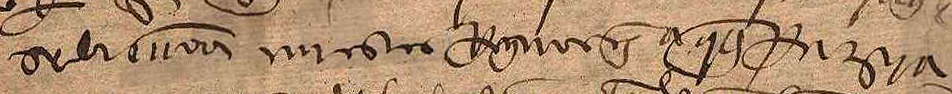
sydor moor em estes Regnos c̄ꝭ a q̄ll fazya
